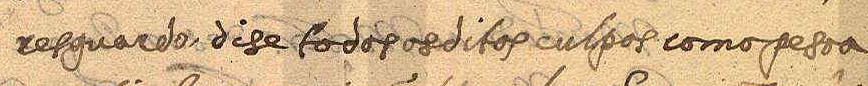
resguardo dise todas as ditas culpas como pesoa
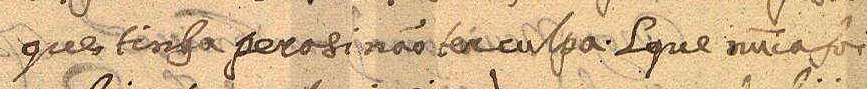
que tinha pera si naõ ter culpa. E que nūca foi
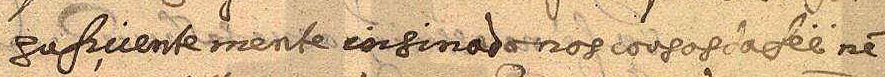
suficientemente insinado nas cousas da fee nē
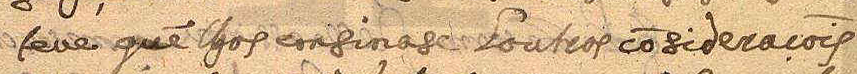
teue quē lhas ensinase E outras cōsideraçoĩs
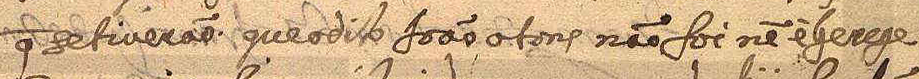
q̄ se tiueraõ que o dito Joaõ atons não foi nē ē herege
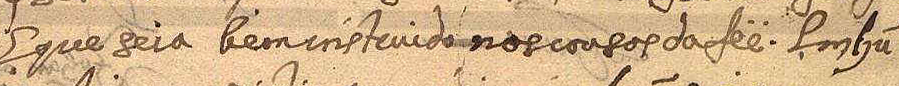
E que seia bem instruido nas cousas da fee. Em hū
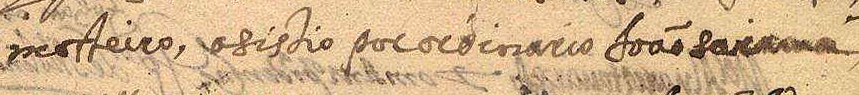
mosteiro, asistio por ordinario Ioaõ saraiua
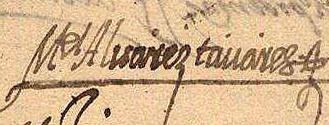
Mel Aluarez tauares
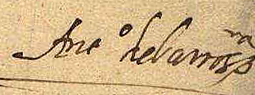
Anto de barros pra
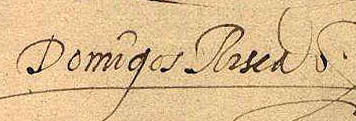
Domīgos Riscado.
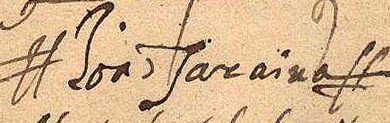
Ioaõ saraiua
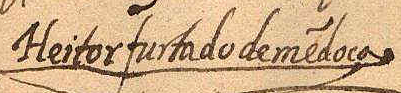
Heitor furtado de mēdoça
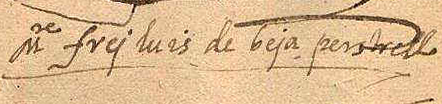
m.te frej luis de beja perstrello
